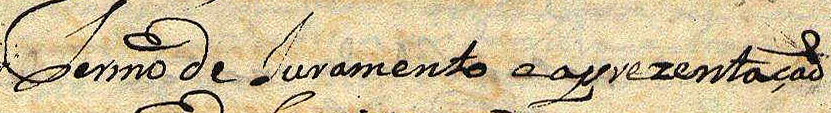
Termo de Iuramento e aprezentação
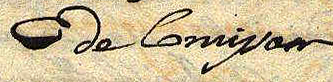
de Comissam
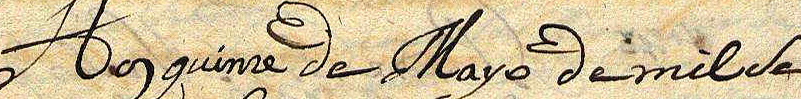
Aos quinze de Mayo de mil se
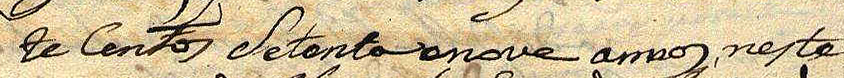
teCentos setenta e nove annos, neste
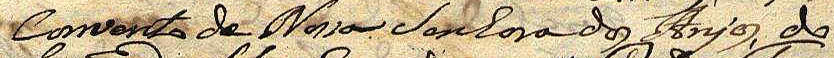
Convento de Nossa Senhora dos Anjos, do
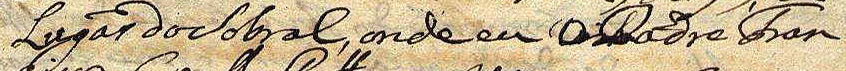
Lugar do Sobral, onde eu O Padre Fran
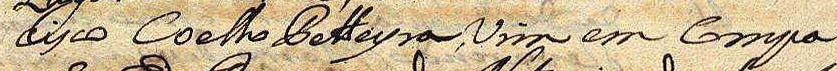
cisco Coelho Petteyra, Vim em compa
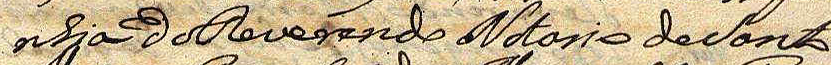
nhia do Reverendo Notario de Santo
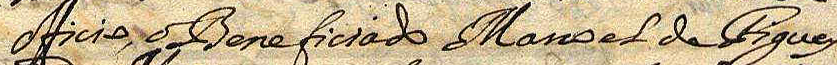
officio, o Beneficiado Manoel de Figuey
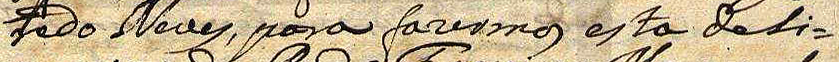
redo Neves, para fazermos esta deli
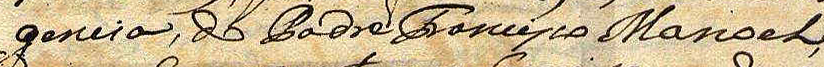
gencia, do Padre Francisco Manoel,
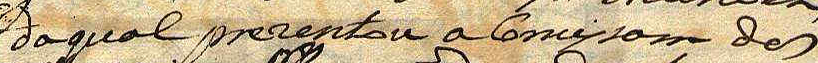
do qual prezentou a Comissam dos
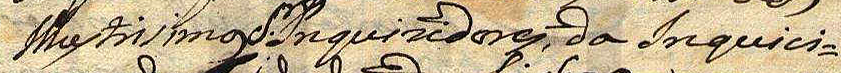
Illustrisimos s.res Inquizidores, da Inquici
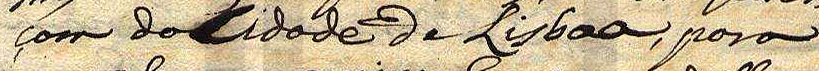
çam da Cidade de Lisboa, para
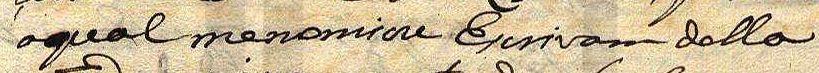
o qual me nomiou Escrivam della
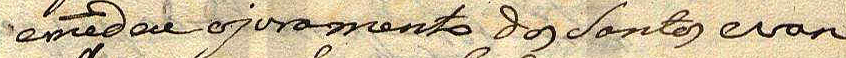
e me deu o juramento dos Santos evan
